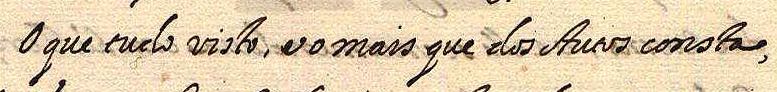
O que tudo visto, e o mais que dos Autos consta,
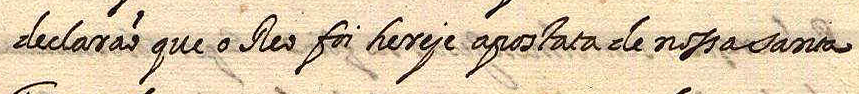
declaraõ que o Reo foi hereje apostata de nossa santa
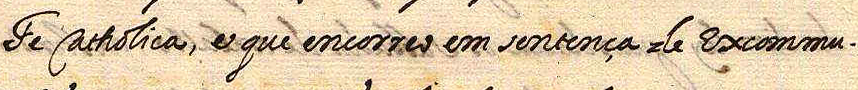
Fe Catholica, e que encorreo em sentença de Excommu
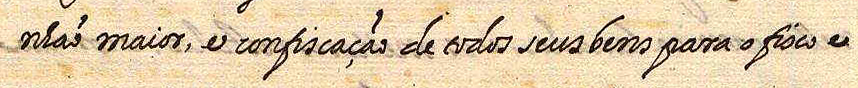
nhaõ maior, e confiscação de todos seus bens para o fisco e
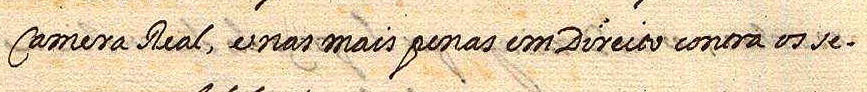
Camera Real, e nas mais penas em Direito contra os se
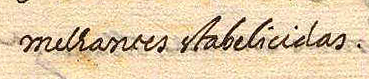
melhantes estabelicidas.
